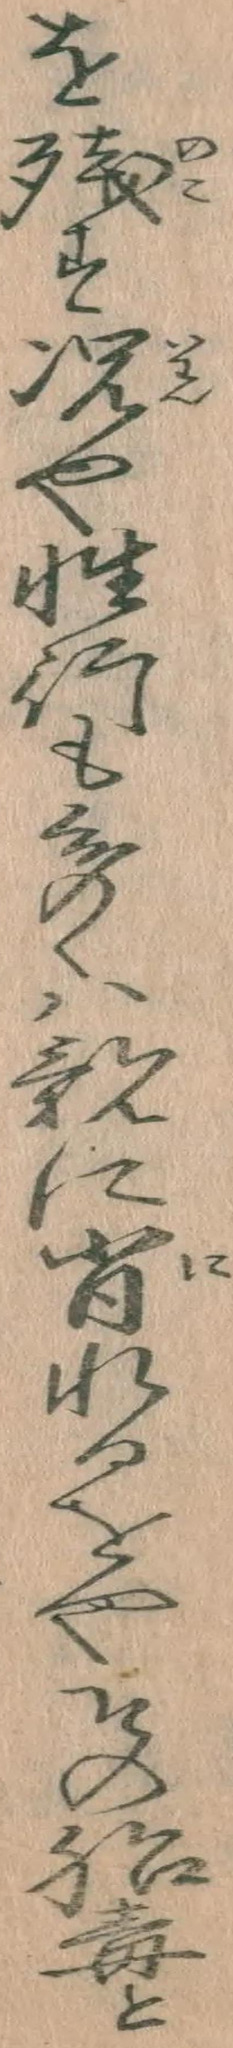を残す況や性行も多くは教に肖れるをやその胎毒と
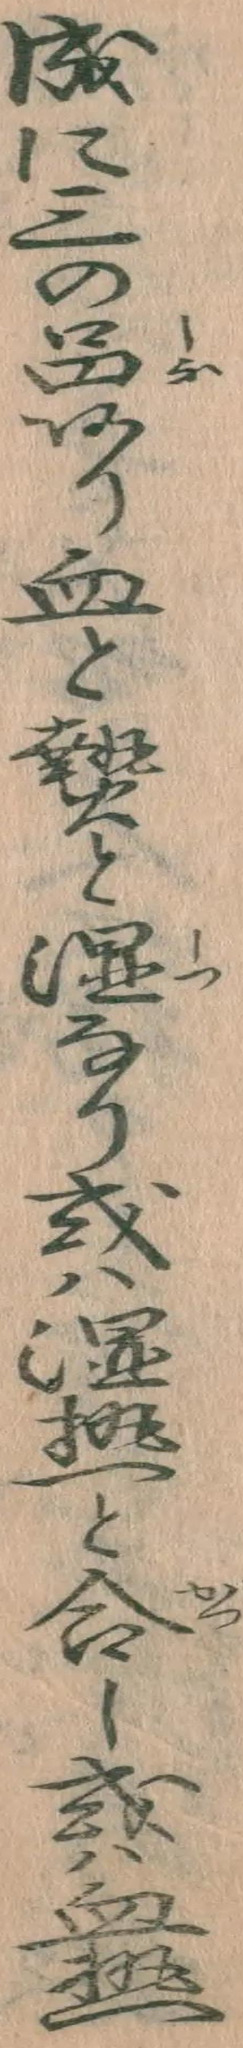成に三の品あり血と熱と湿なり或は湿熱と合し或は血熱
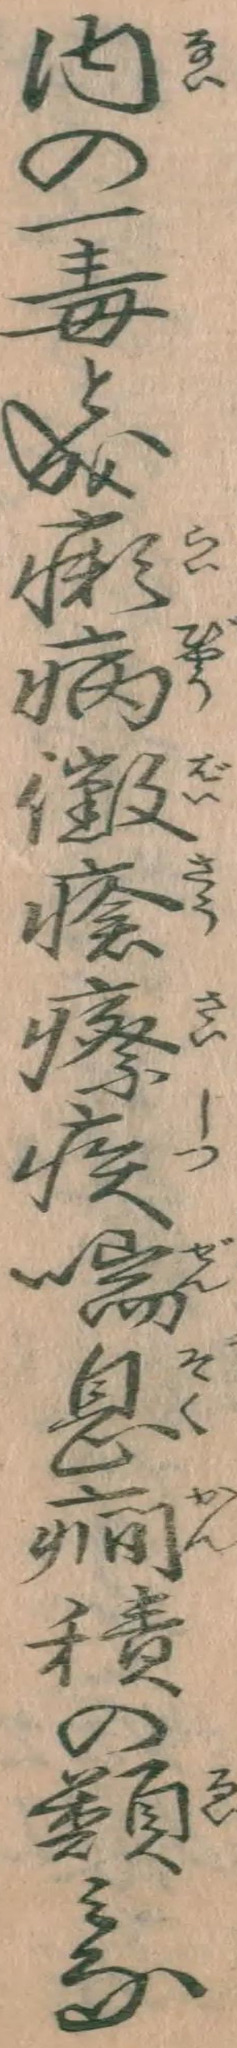内の一毒と成癩病黴瘡瘵疾喘息癇積の類みな
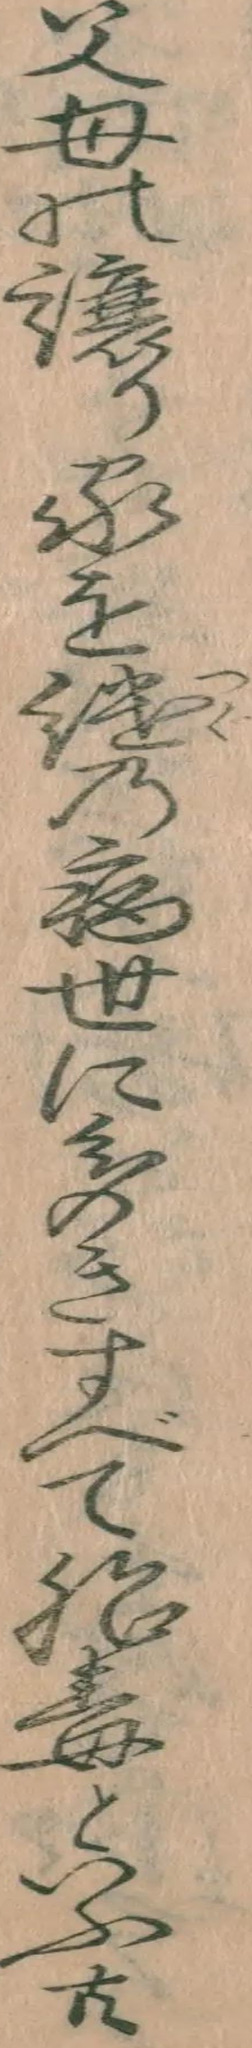父母の譲り家を継の病世に多きすべて胎毒といふ共
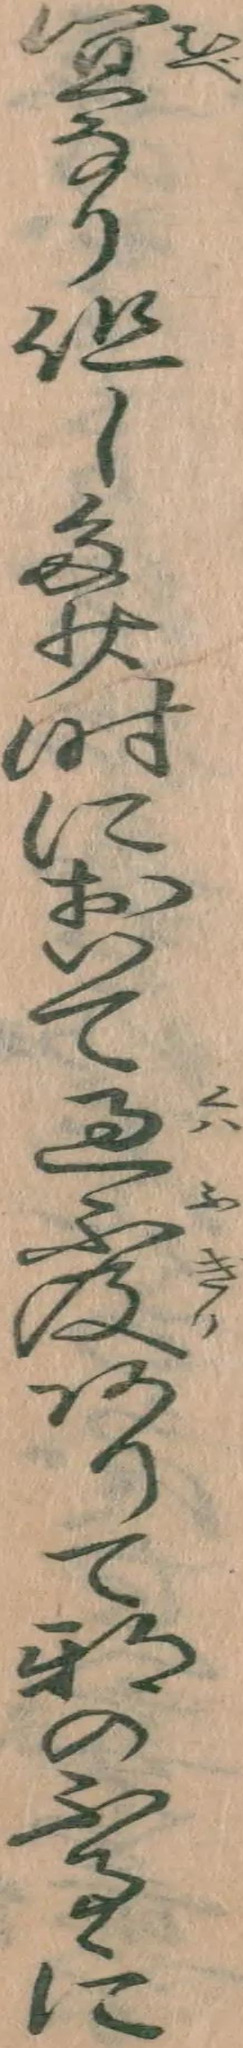宜なり但し多少時において過不及ありて邪のふるゝに
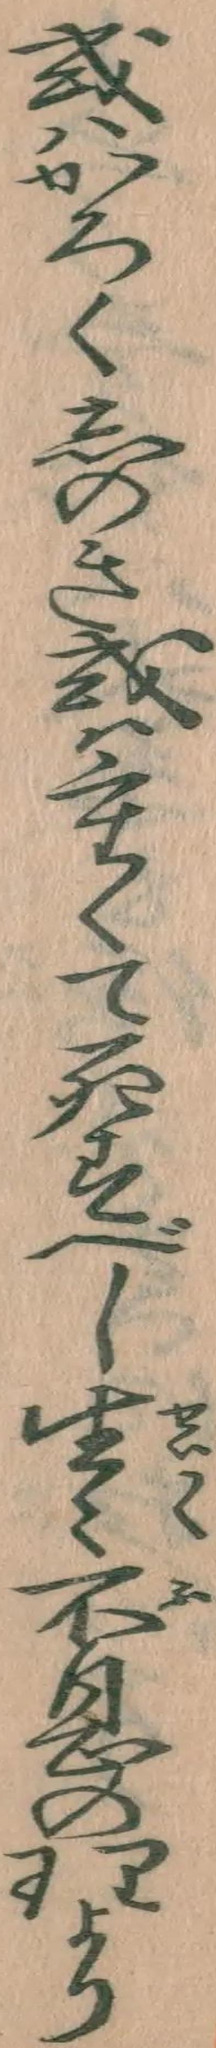或はかろくしのき或は重くて死すべし生々不息の理より
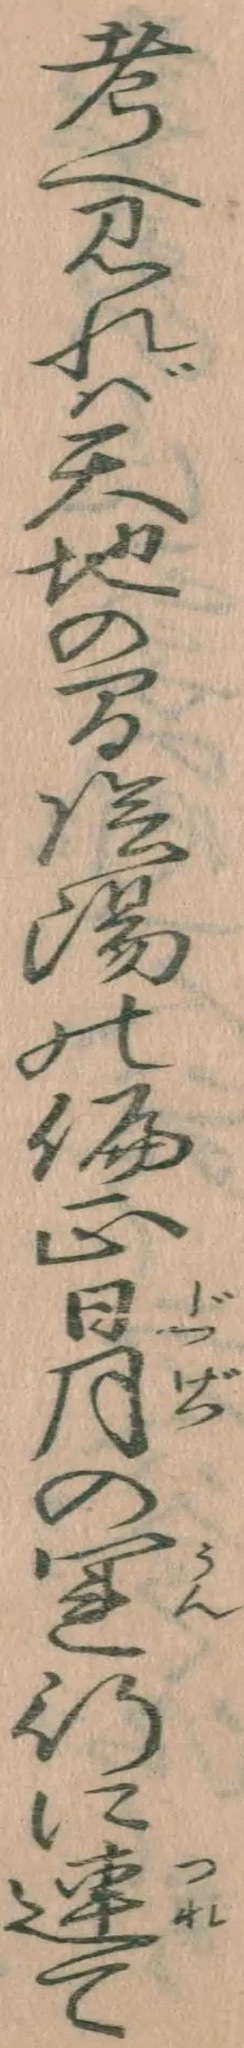考へ見れば天地の間陰陽の偏正日月の運行に連て
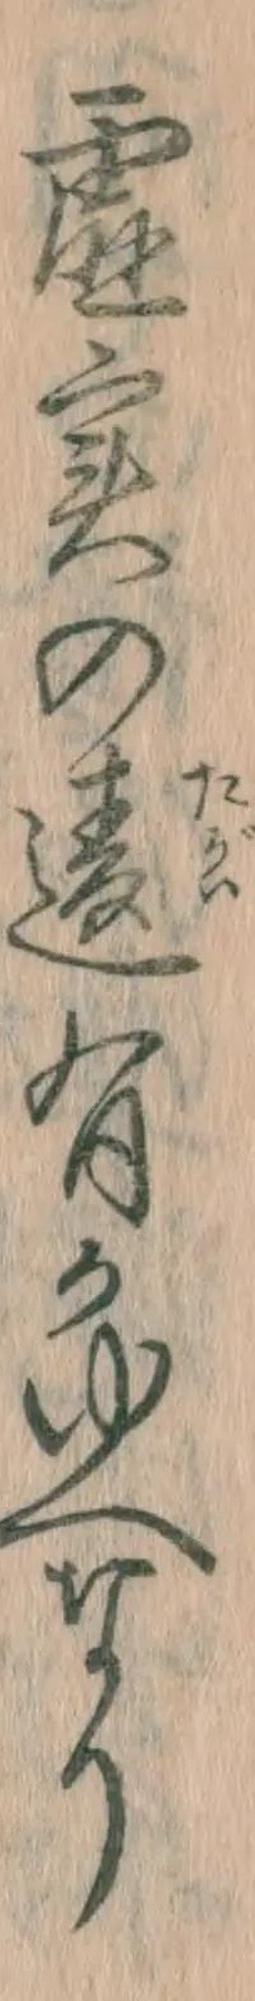虚実の違有かゆへなり
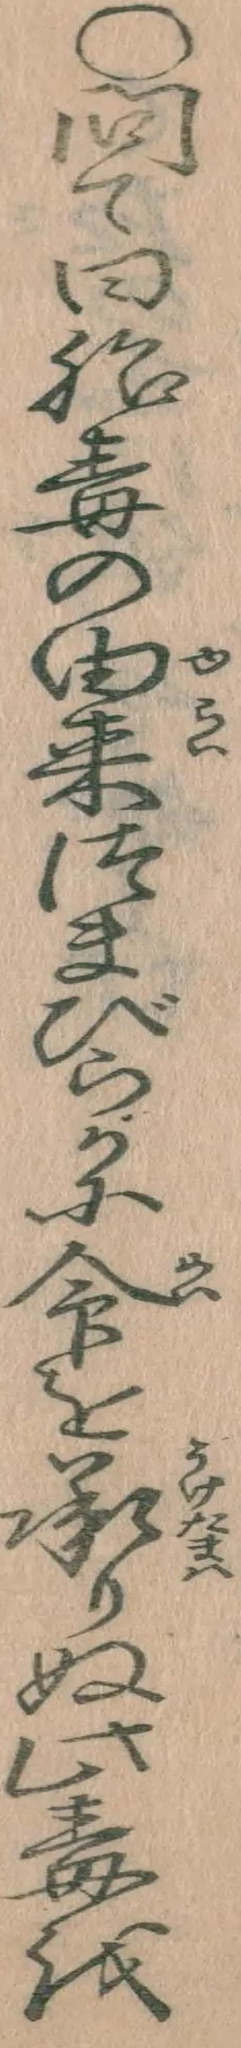○問て曰胎毒の由来つまびらかに命を承りぬ此毒を
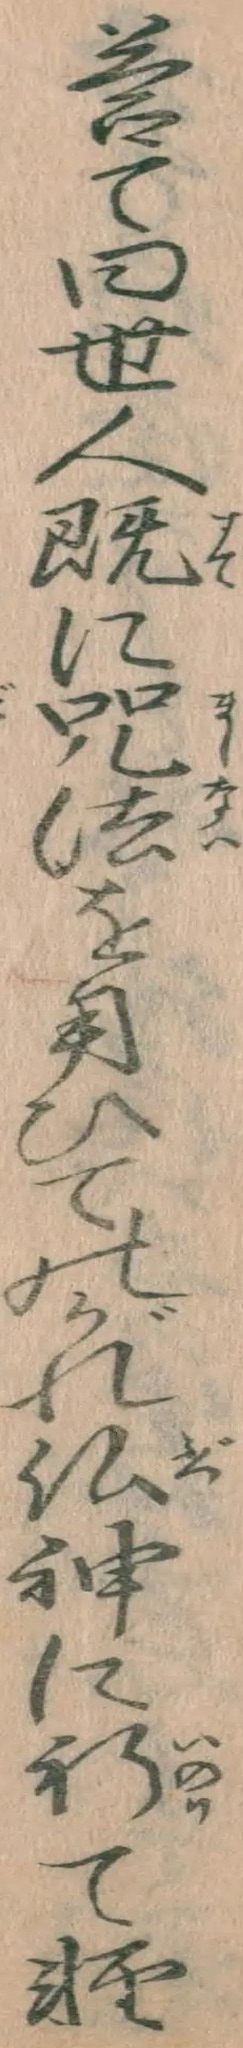答て曰世人既に呪法を用ひてのがれ仏神に祈て軽
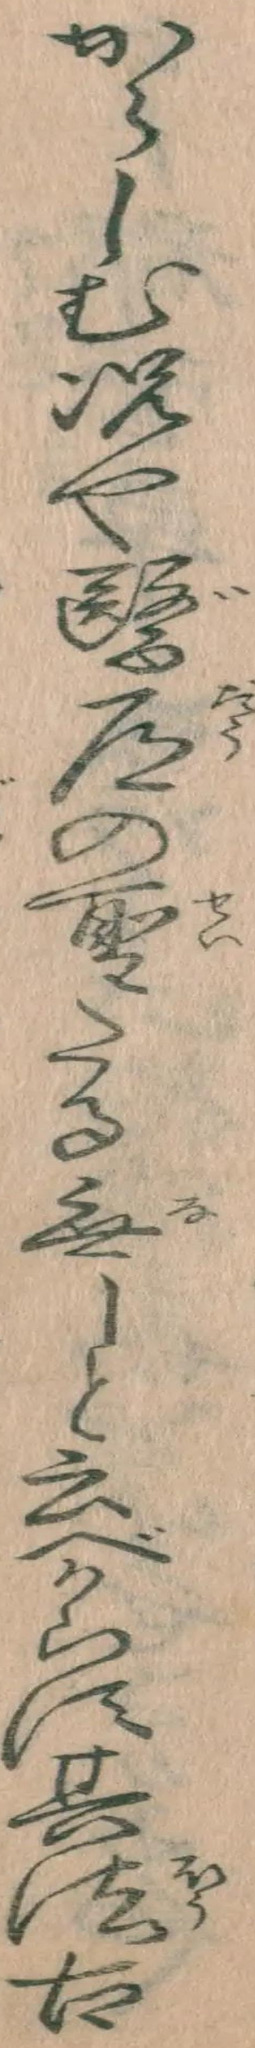からしむ況や医道の聖たる無しと云べからす其法古
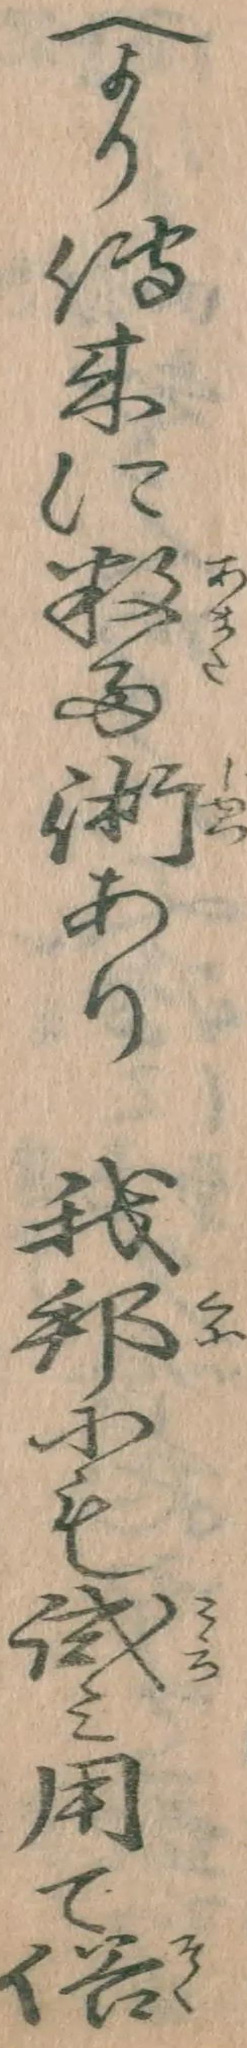へより伝来に数多術あり我邦にも試み用て俗

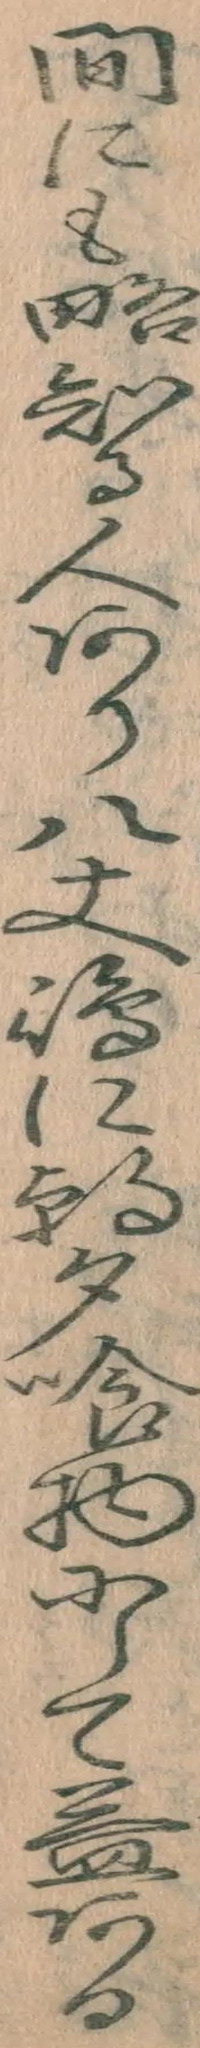間にも略知る人あり八丈嶋に朝夕喰物にして益ある
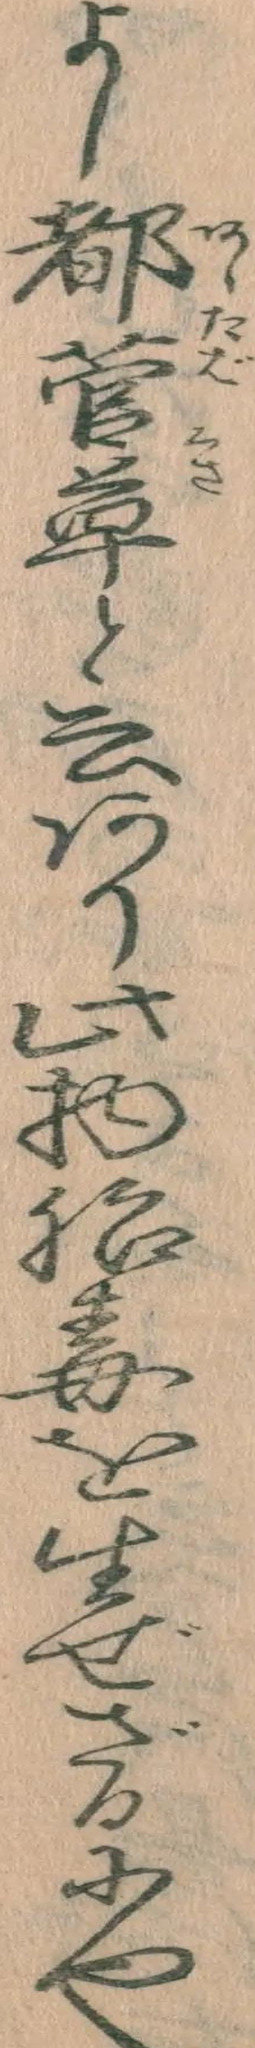よし都菅草と云あり此物胎毒を生ぜざるにや
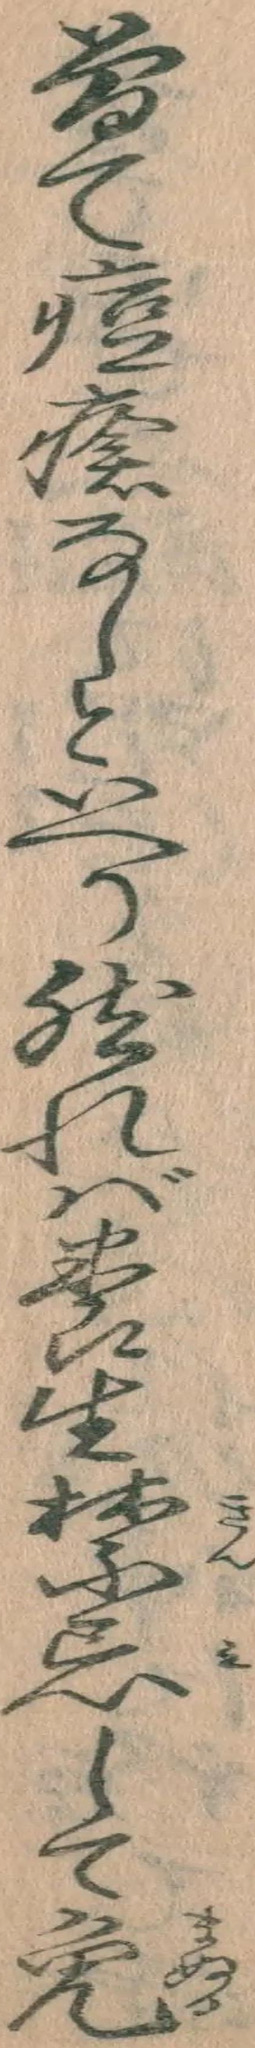曽て痘瘡なしといへり然れば養生禁忌して免
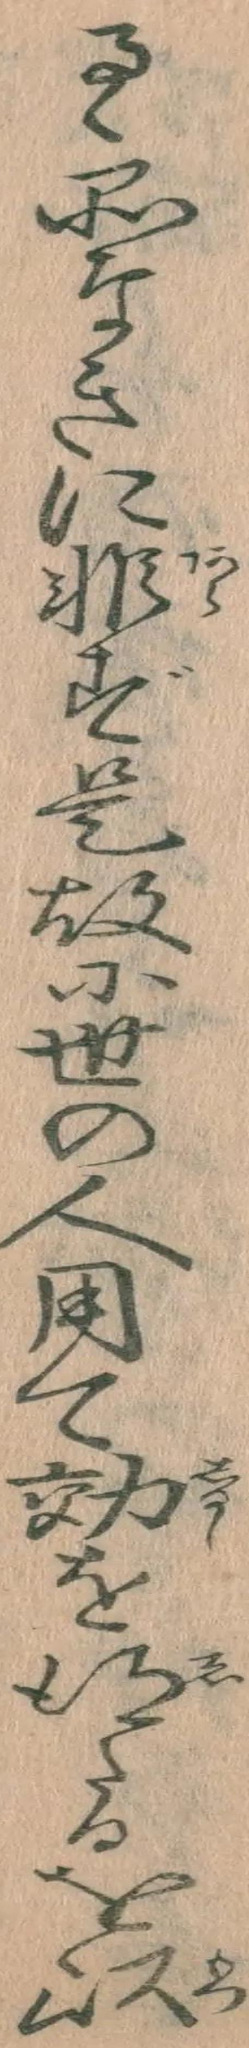るゝ品なきに非ず是故に世の人用て効を得たるを以
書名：痘家初心問答
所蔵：国立国会図書館 National Diet Library, JAPAN
